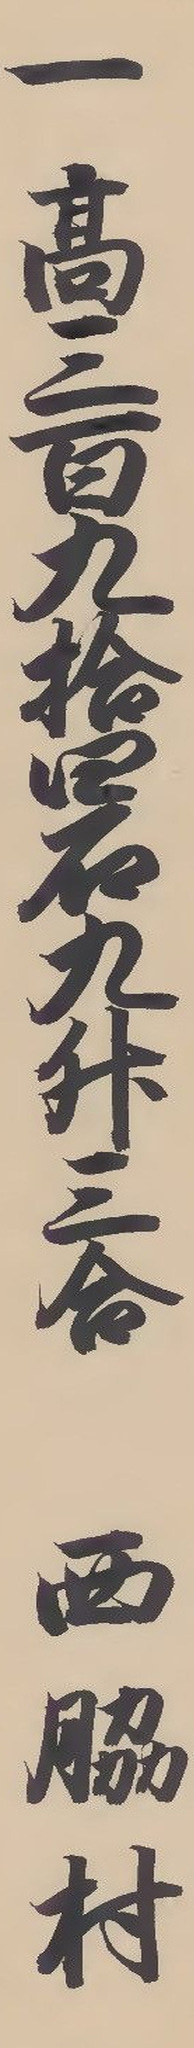一高三百九拾四石九升三合西脇村

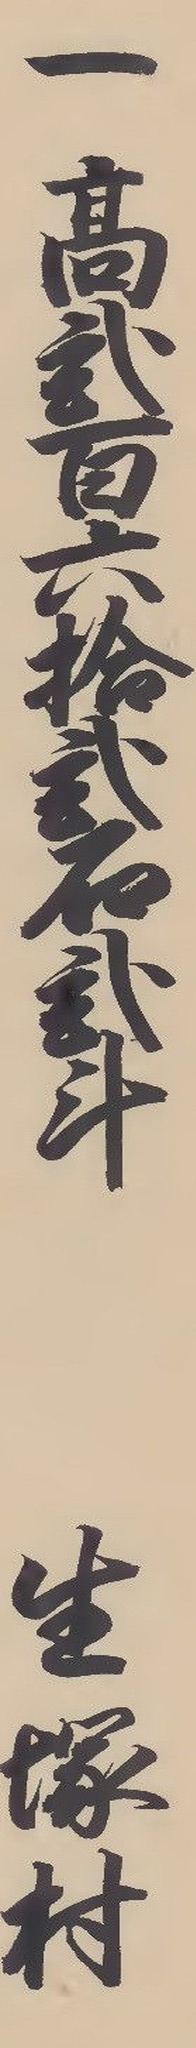一高弐百六拾弐石弐斗生塚村
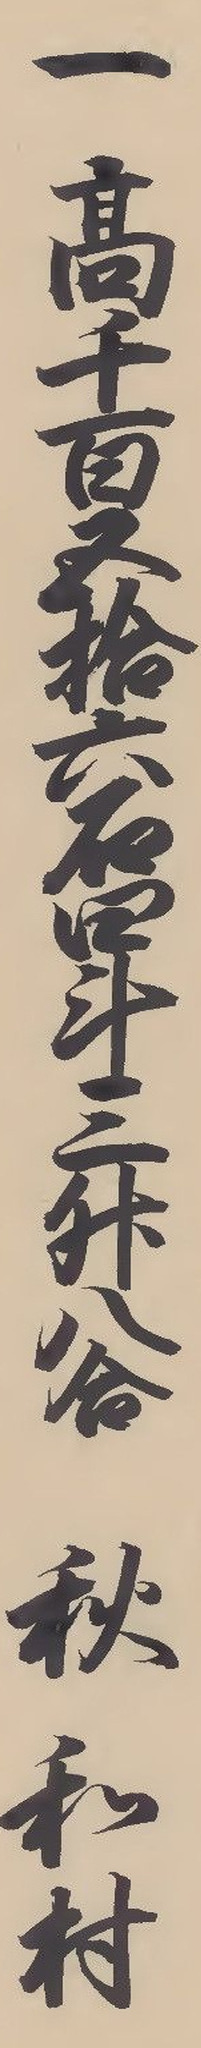一高千百五拾六石四斗三升八合秋和村
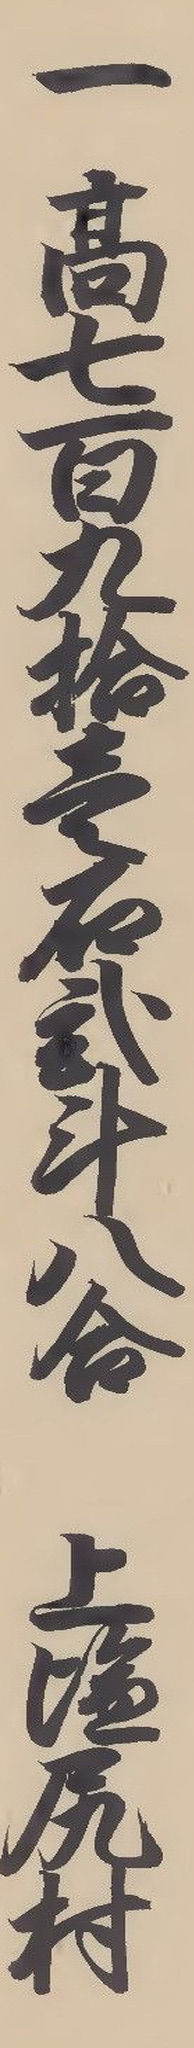一高七百九拾壱石弐斗八合上塩尻村
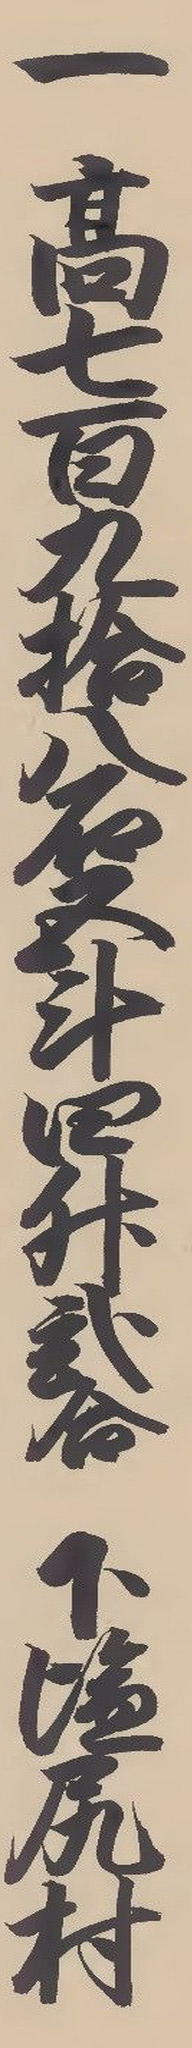一高七百九拾八石五斗四升弐合下塩尻村
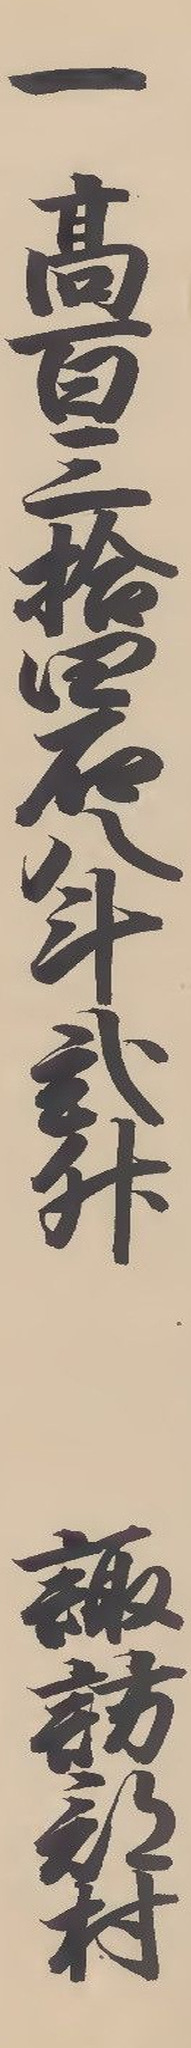一高百三拾四石八斗弐升諏訪部村
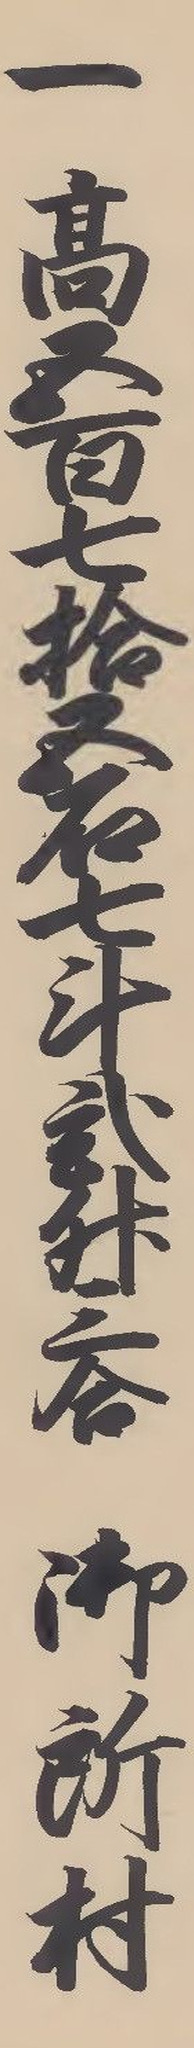一高五百七拾五名七斗弐升三合御所村
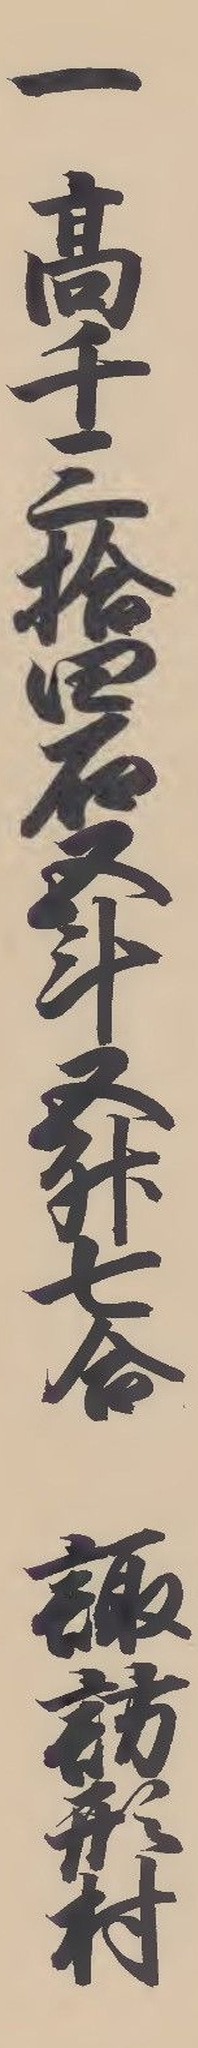一高千三拾四石五斗五升七合諏訪形村

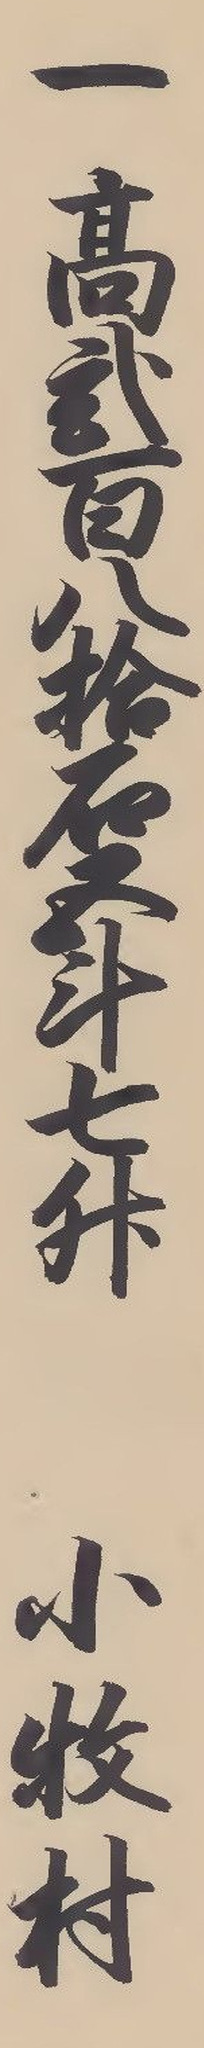一高弐百八拾石五斗七升小枚村
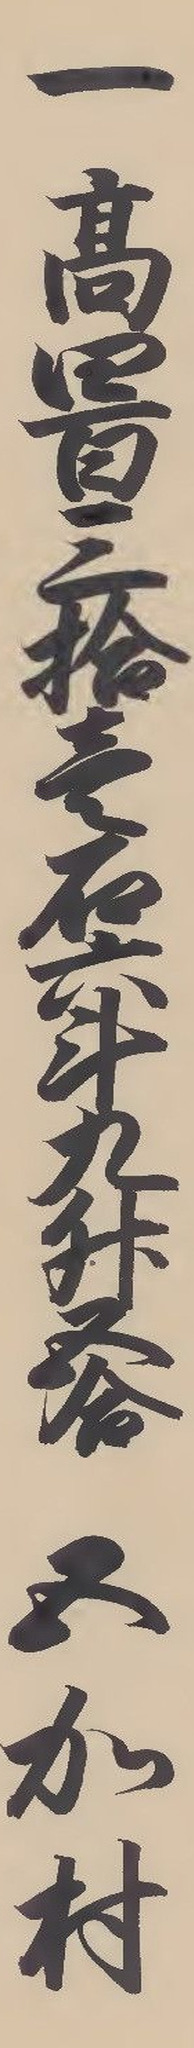一高四百三拾壱石六斗九升五合五加村
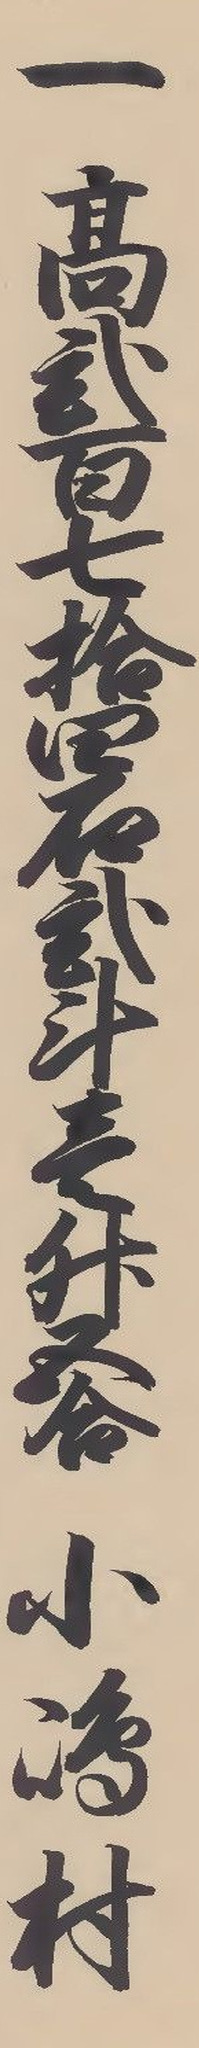一高弐百七拾四石弐斗壱升五合小島村
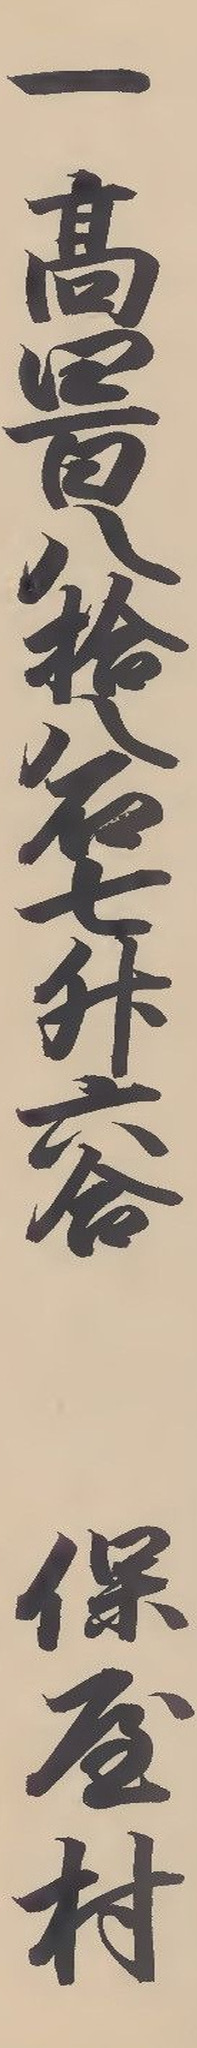一高四百八拾八石七升六合保屋村
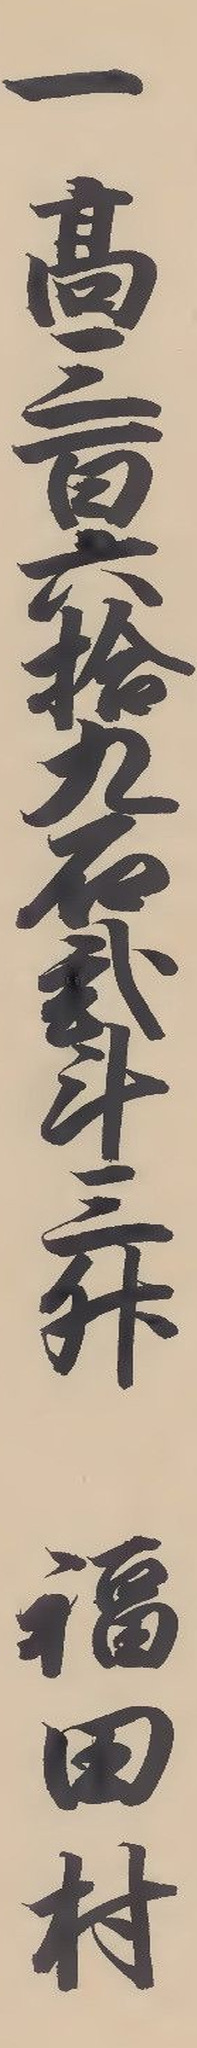一高三百六拾九石弐斗三升福田村
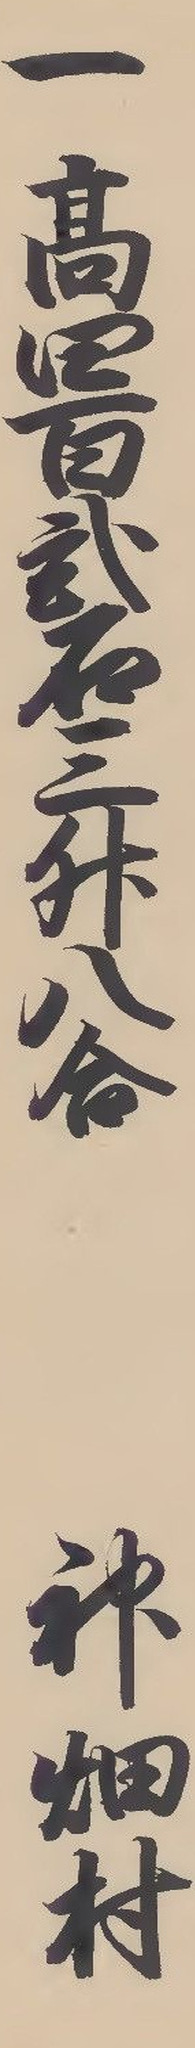一高四百弐石三升八合神畑村

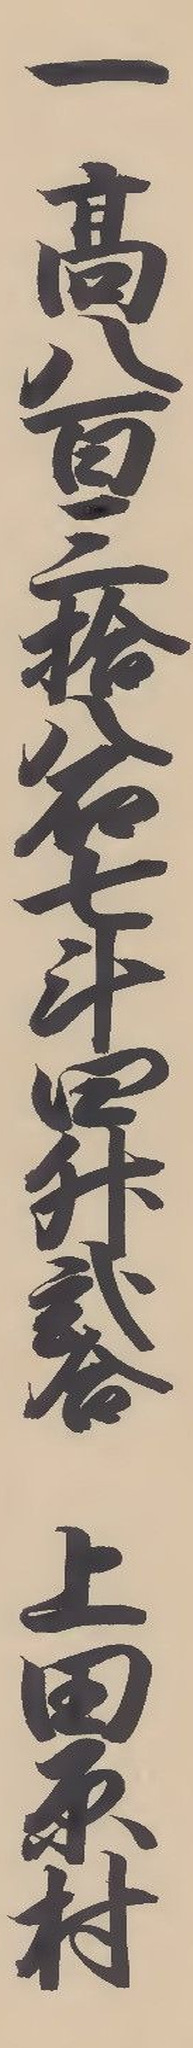一高八百三拾八石七斗四升弐合上田原村
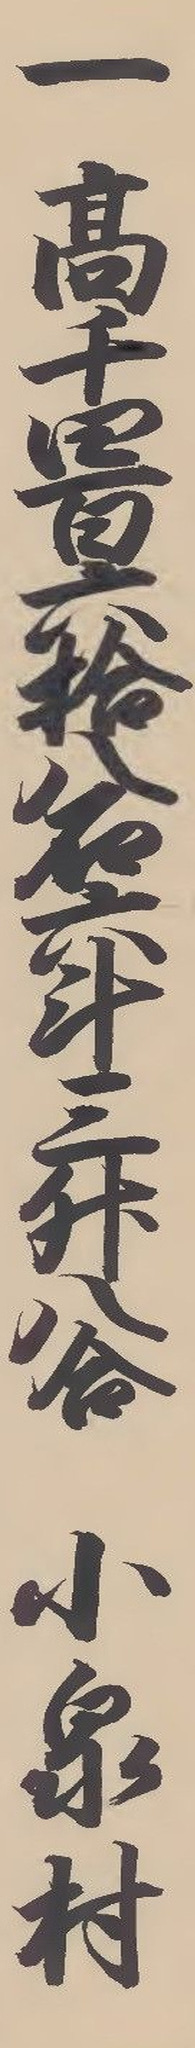一高千四百六拾八石六斗三升八合小泉村
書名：信濃国郷帳
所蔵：国立公文書館 National Archives of Japan
